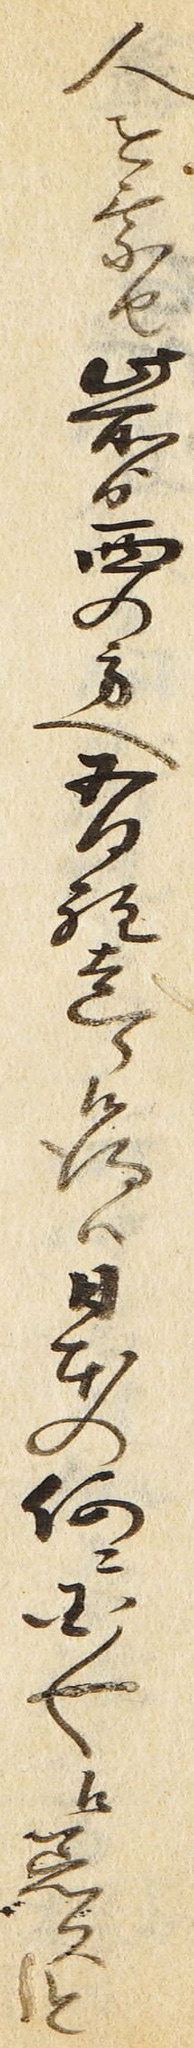人を乗せ此所ゟ西の方へ有程走り候得は日本の何々国〳〵え着すと
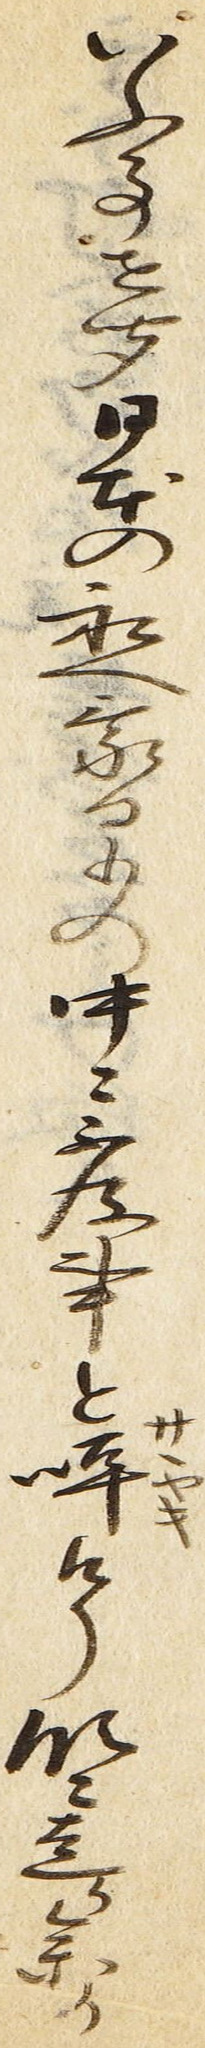いふ事を聞日本の船へ乗るもの中々不及事と囁けり段々走り参り
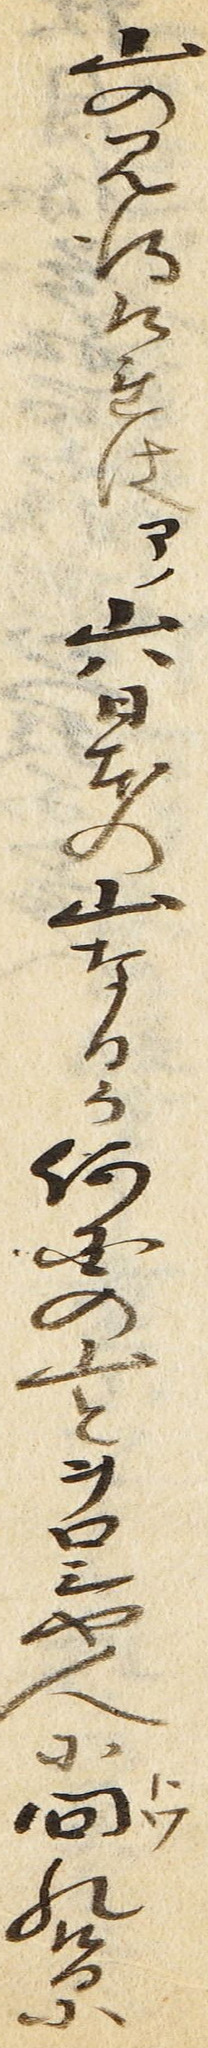山の見得けれはあの山は日本の山なるか何国の山とヲロシヤ人に問れけるに
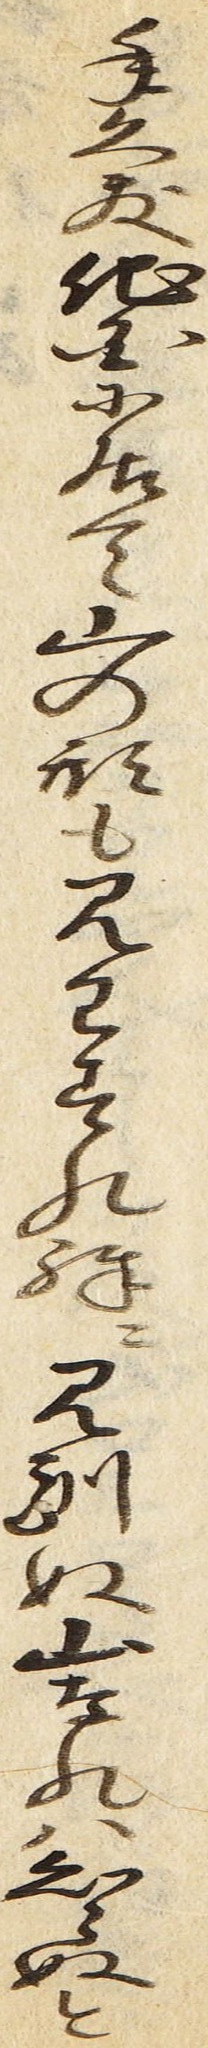年久敷他国に居て山の形も見わすれ誠に見馴ぬ山なれは知らぬと
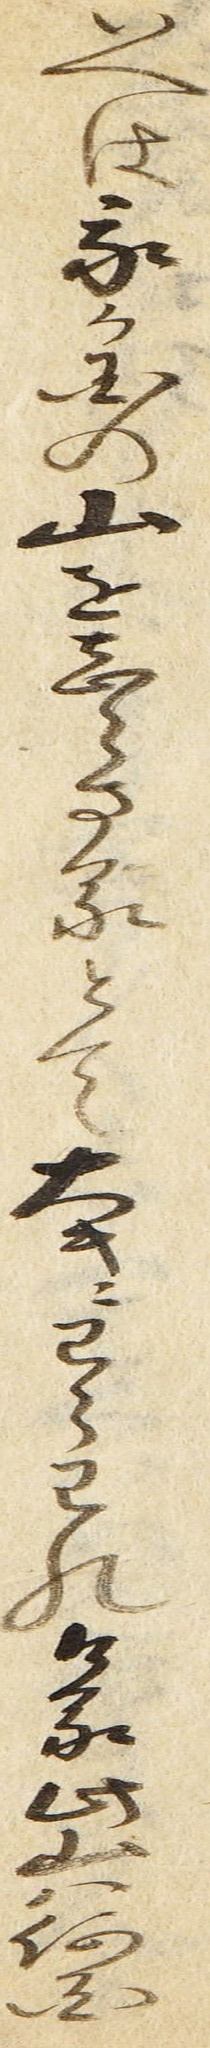いへは我か国の山をしらさるとて大きにわらわれける此山は何国
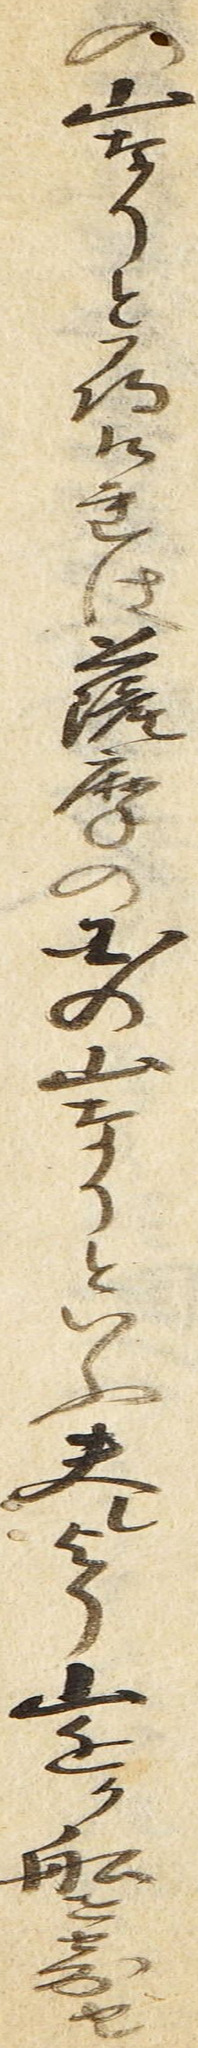の山なりと尋けれは薩摩の国の山なりしといふ夫れより山近く寄せ
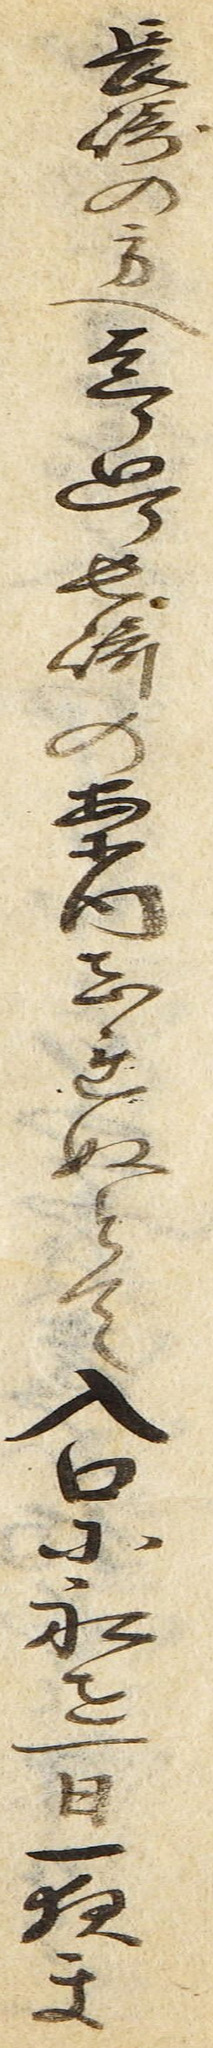長崎の方へ走り廻り長崎の案内しれぬとて入口に船を一日一夜ま
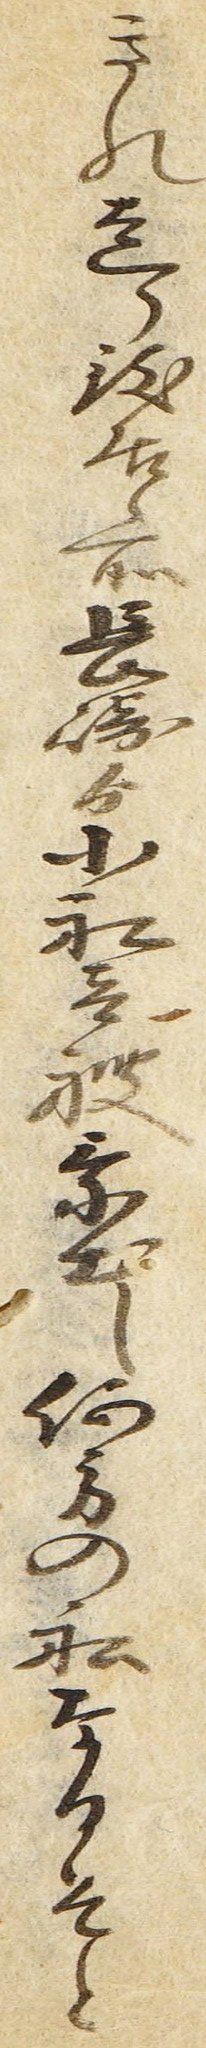きれ走り致居候所長崎ゟ小船一艘乗出し何方の船なるそと
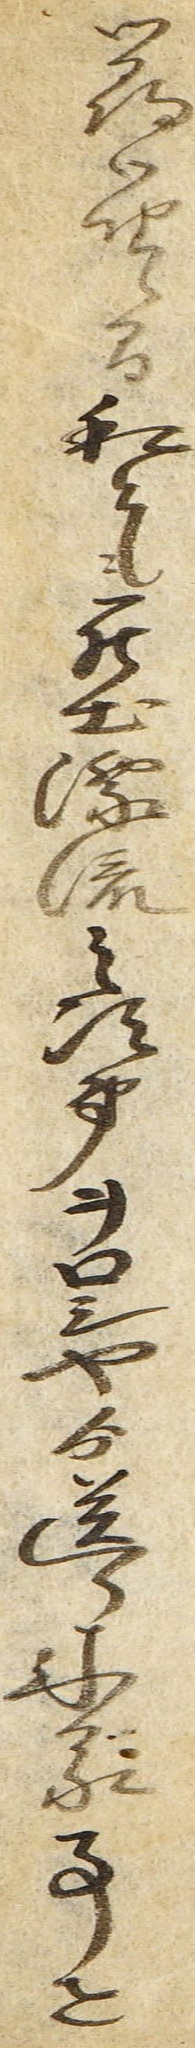御尋御坐候間私とも罷出漂流之次第ヲロシヤゟ送り来る事を

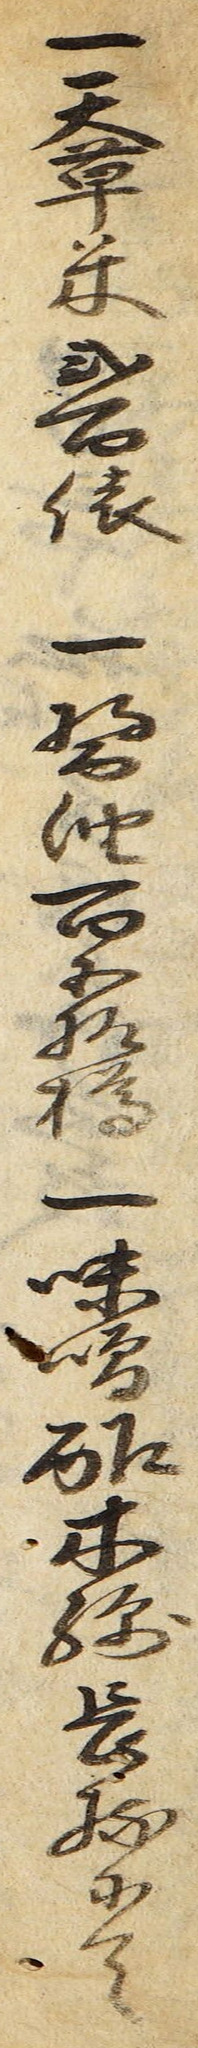一天草米弐百俵一醤油百五拾樽一味噌酢木綿長持にて
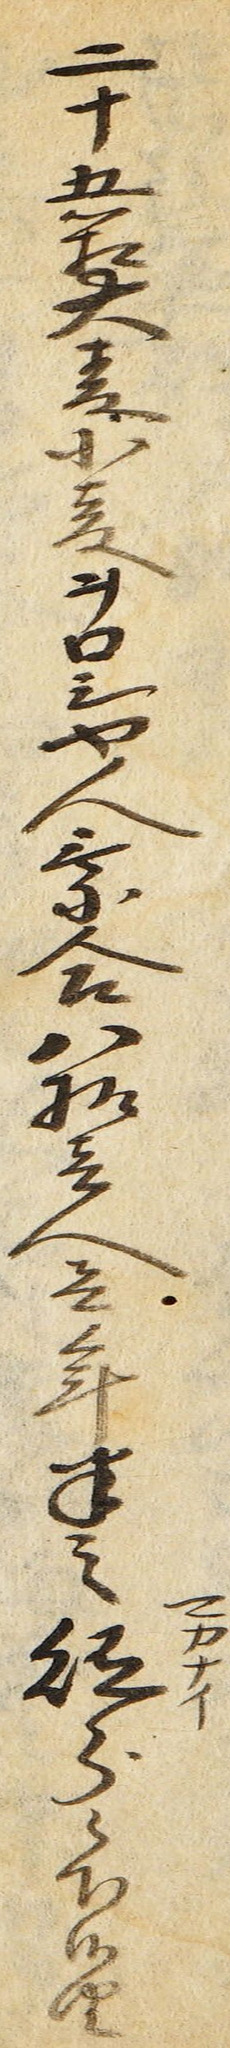二十五箱大麦小麦ヲオロシヤ人乗合八拾壱人壱年半之賄分被下候由
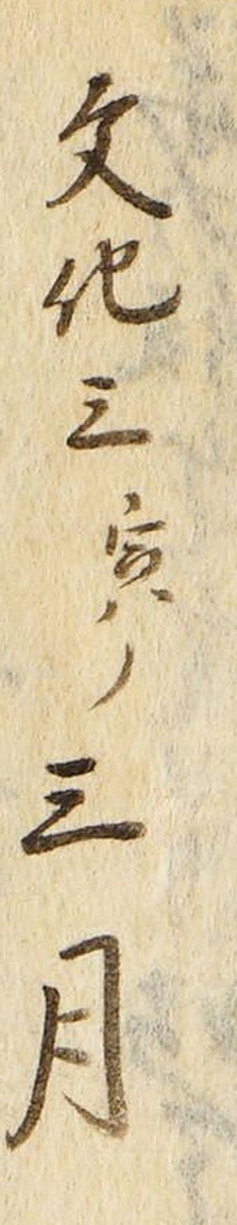文化三寅ノ三月
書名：外国漂流記
